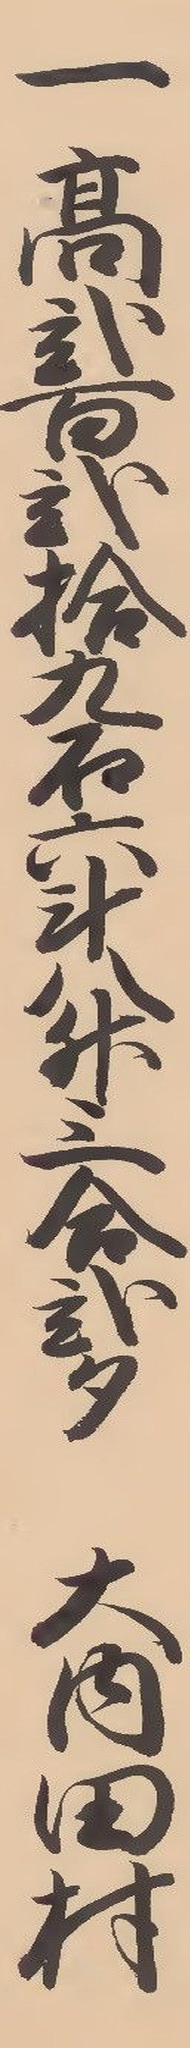一高弐百弐拾九石六斗八升三合弐勺大内田村
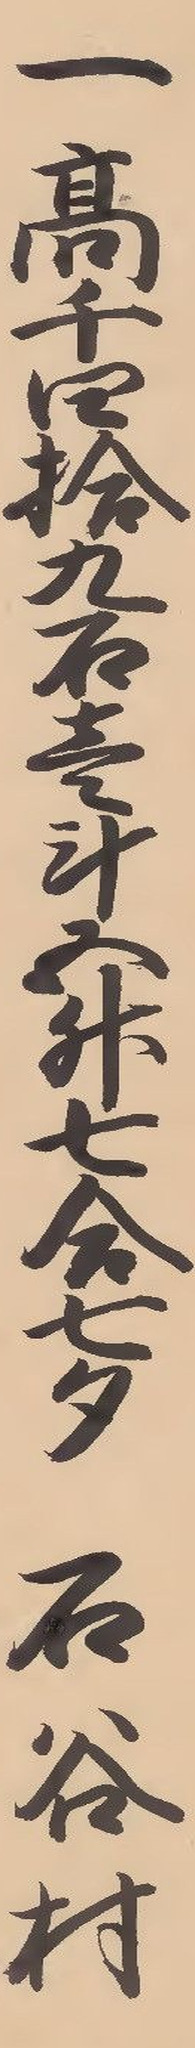一高千四拾九石壱斗五升七合七勺石谷村
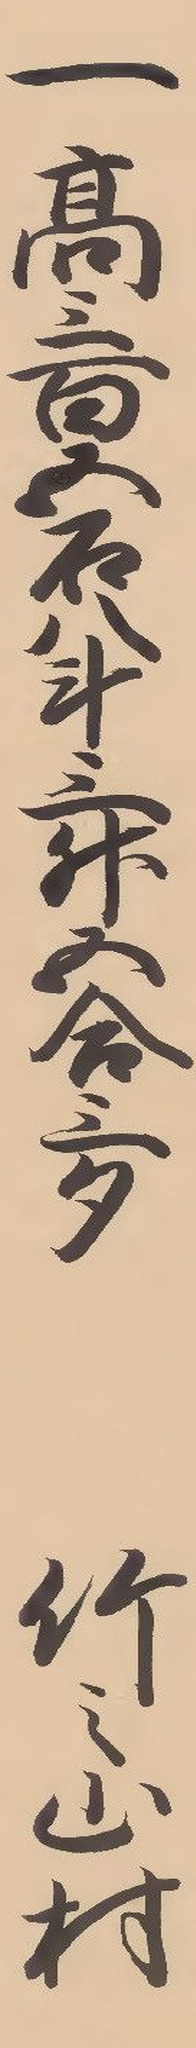一高三百五石八斗三升五合三勺竹之山村
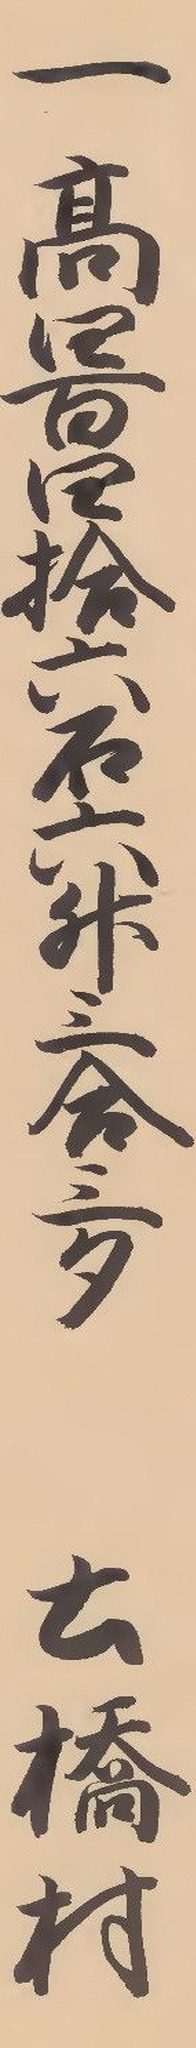一高四百四拾六石六升三合三勺土橋村
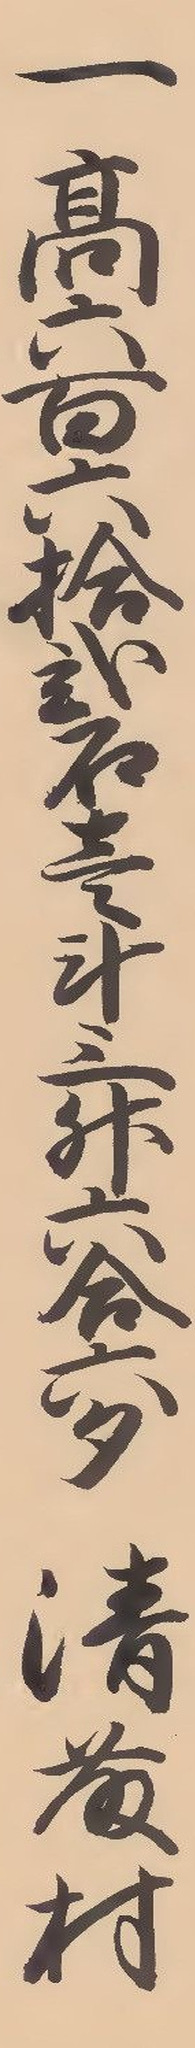一高六百六拾弐石壱斗三升六合六勺清藤村

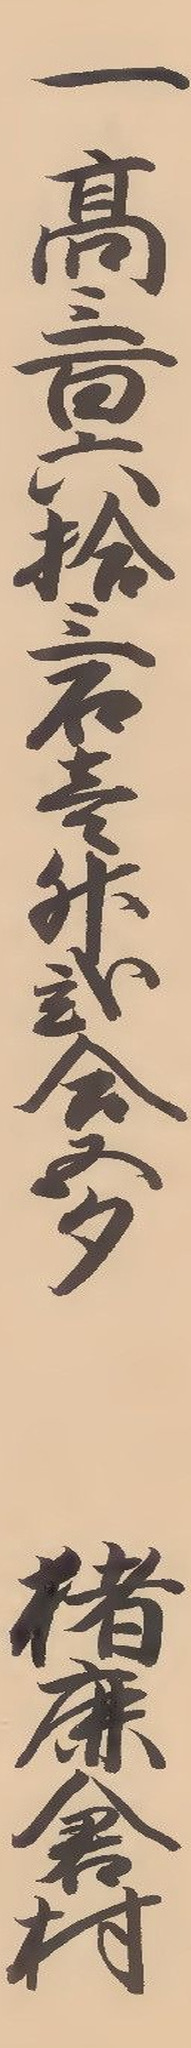一高三百六拾三石壱斗弐合五勺猪鹿倉村
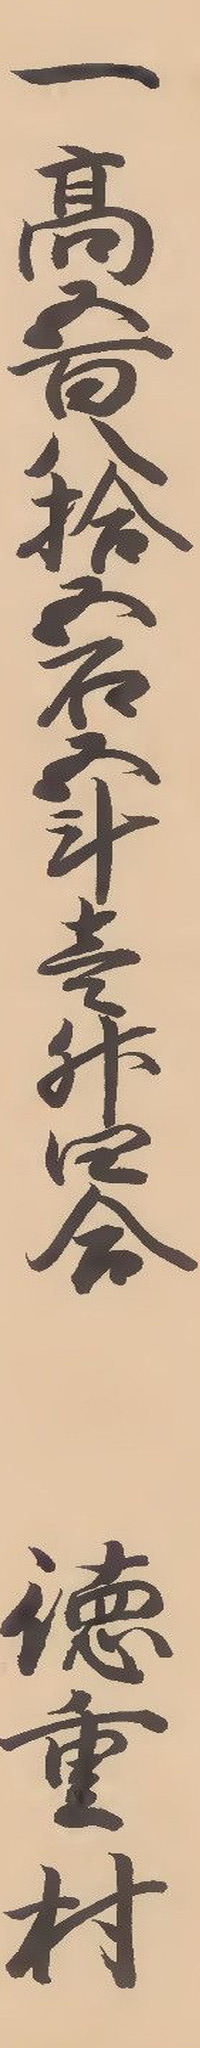一高五百八拾五石五斗壱升四合徳重村
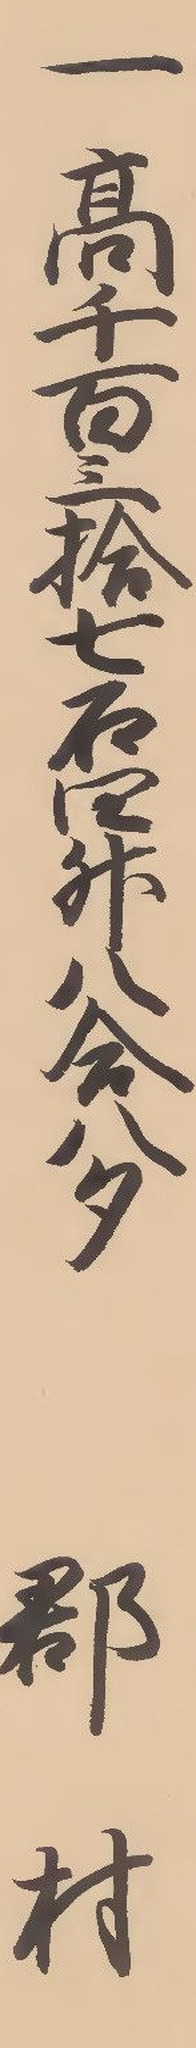一高千百三拾七石四升八合八勺郡村
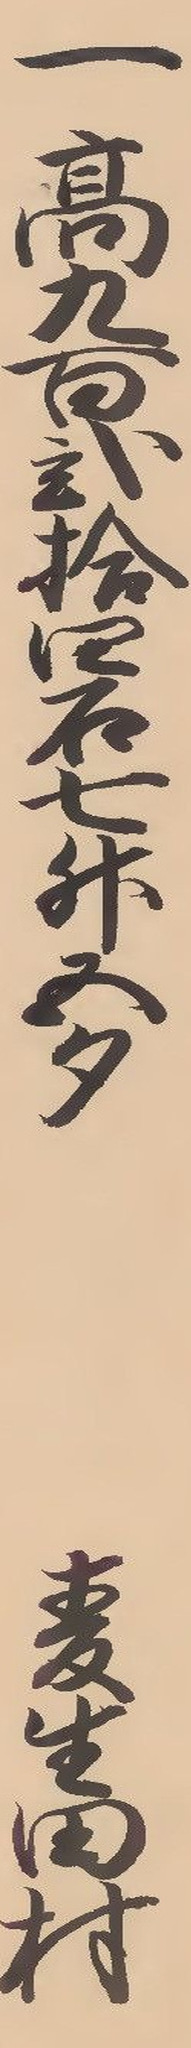一高九百弐拾四石七升五勺麦生田村
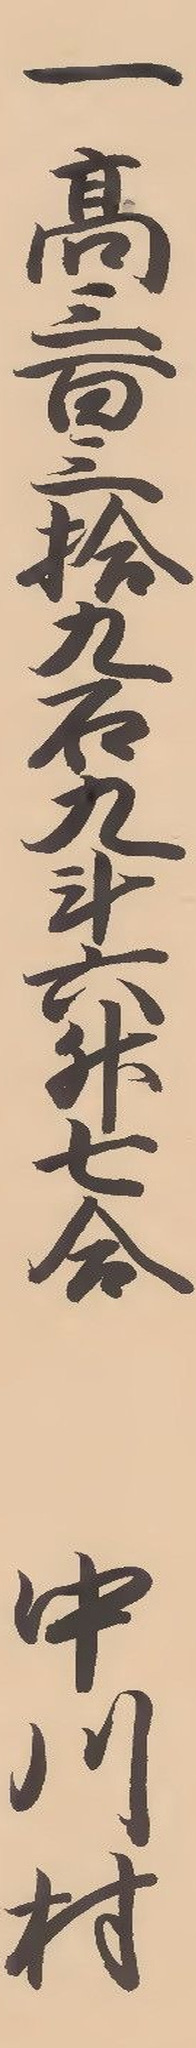一高三百三拾九石九斗六升七合中川村
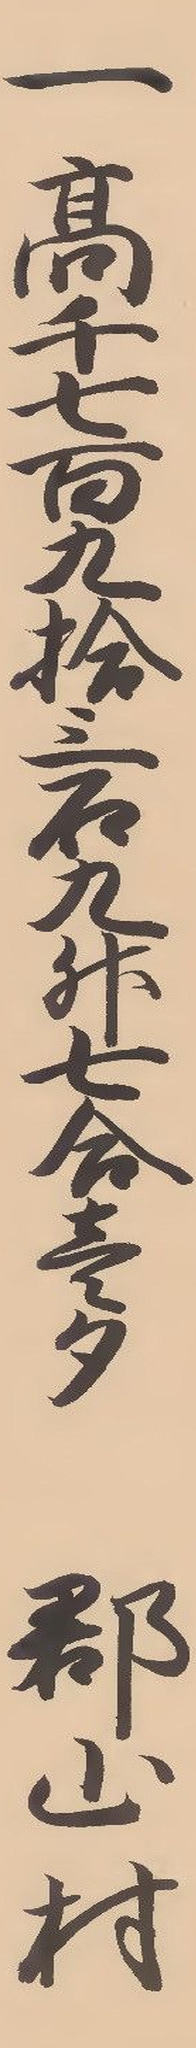一高千七百九拾三石九升七合壱勺郡山村
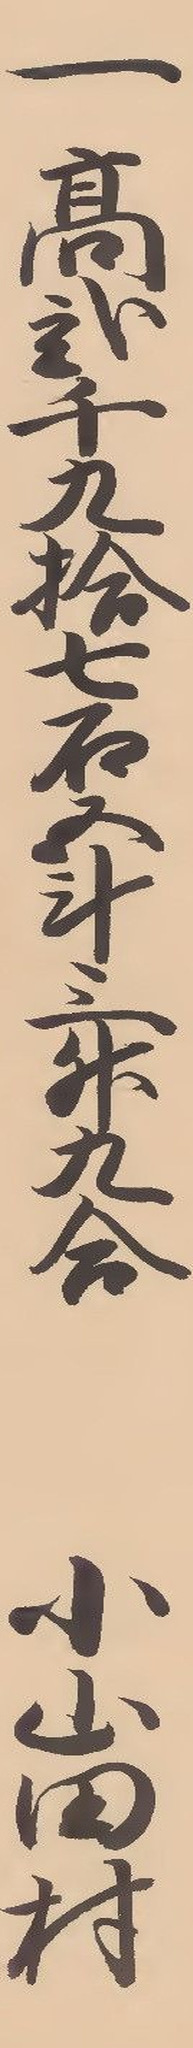一高弐千九拾七石五斗三升九合小山田村
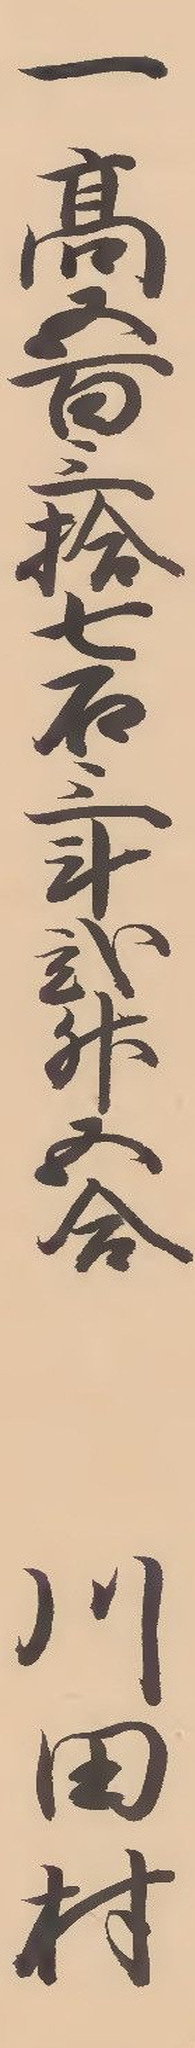一高五百三拾七石三斗弐升五合川田村

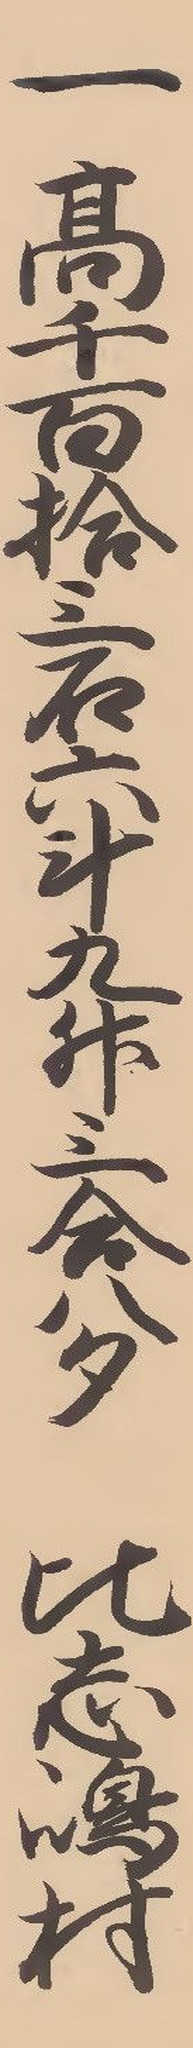一高千百拾三石六斗九升三合八勺比志島村
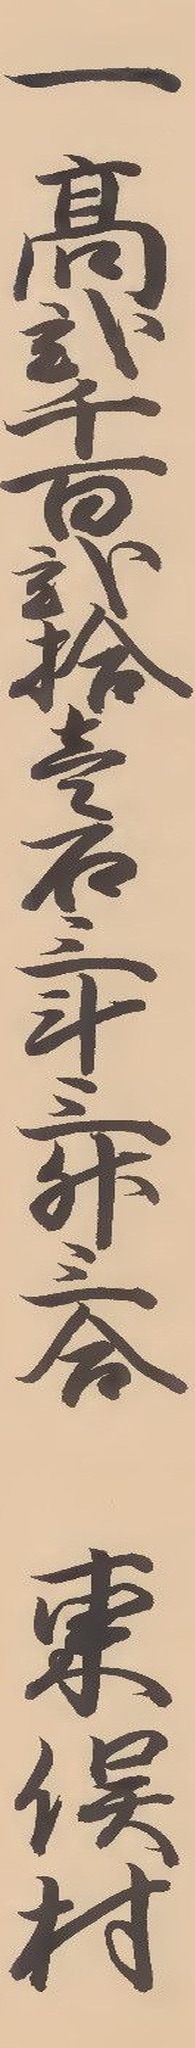一高弐千百弐拾壱石三斗三升三合東俣村
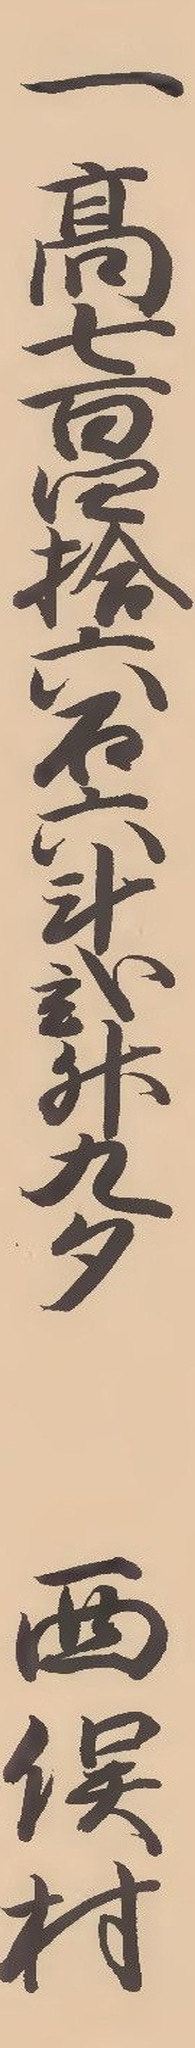一高七百四拾六石六斗弐升九勺西俣村
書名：薩摩国郷帳
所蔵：国立公文書館 National Archives of Japan
